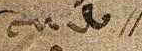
cudo //
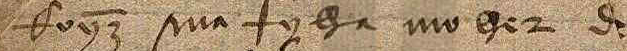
Roȳz sua fylha molher de
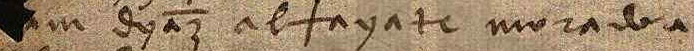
am dyaz alfayate moradoa
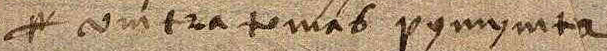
item comtra tomas pymymta
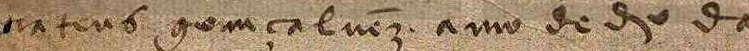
mateus gomçaluez amo de djo da
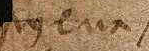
sylua /
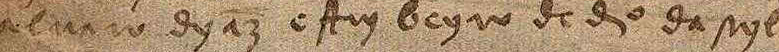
aluaro dyaz estrybeyro de djo da syl
